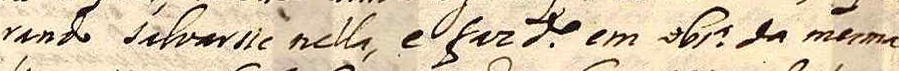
rando salvarsse nella, e fazd.o em obs.a da mesma
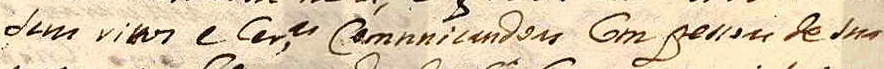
seus rittos e Cer,as Comunicandoas Com pessoas de sua
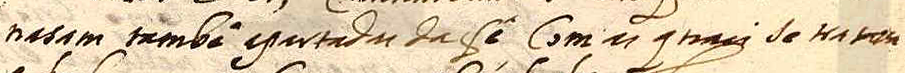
nasam tambē apartadas da fê, Com as quais se tratou
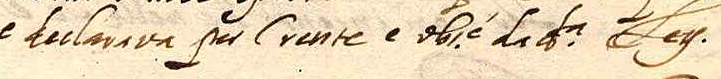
e declarava por Crente e obs.e da d̄a. Ley.
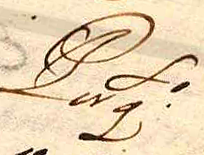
Porq.to
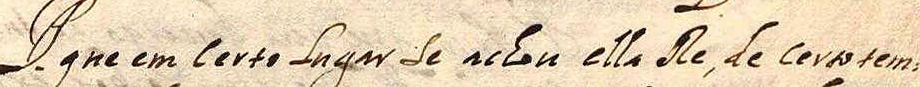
P. que em certo Lugar se achou ella Re, de certo tem
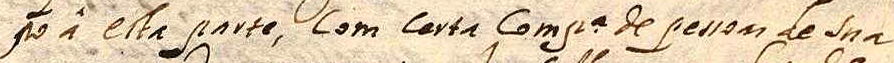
po â esta parte, com certa comp.a de pessoas de sua
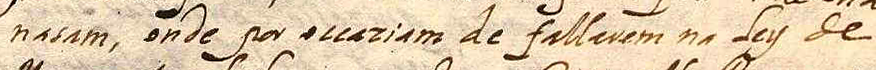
nasam, onde por occaziam de fallarem na Ley de
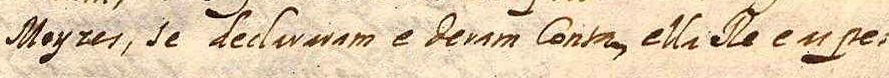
Moyzes, se declararam e deram conta, ella Re e as pe
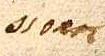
ssoas
